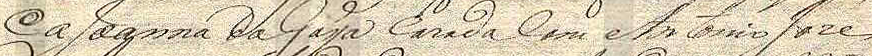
e a Joanna da Gaya cazada com Antonio Jozé
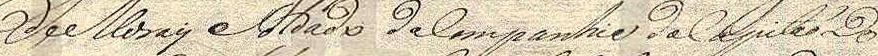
de Morais soldado da Companhia do Capitaõ Do
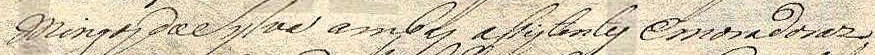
Mingos da Sylva ambos asistentes e moradorez
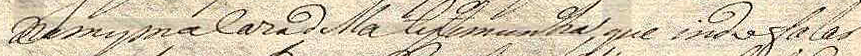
na mesma Caza della testemunha, que indo falar
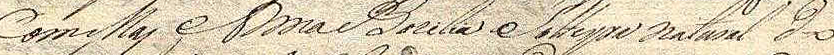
Com ellas e Anna Bazilia Solteyra natural do
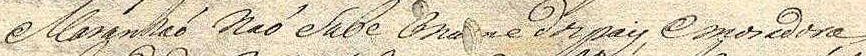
Maranhaõ naõ sabe o m__ e doz pais, e moradora
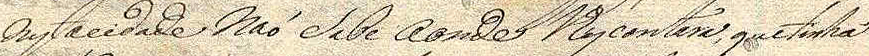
nesta cidade naõ sabe aonde lhes contara que tinha
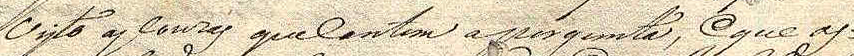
visto as couzas que contem a pergunta, e que as
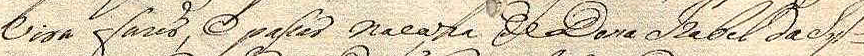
vira fazer, e passar na caza de Dona Izabel da Syl
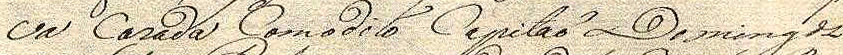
va cazada Com o dito Capitaõ Domingoz
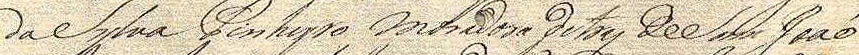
da Sylva Pinheyro moradora detras de Sam Joaõ
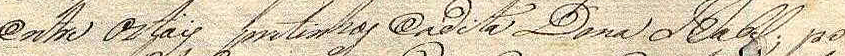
entre oz tais pretinhos e a dita Dona Isabel; po
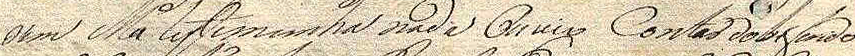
rem ella testemunha nada Ouvio Contar do segredo
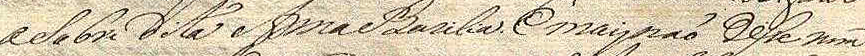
a Sobredita Anna Bazilia E mais naõ disse nem
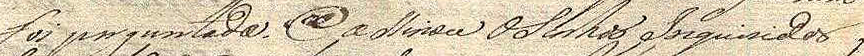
foi perguntada. e assinou o senhor Inquisidor
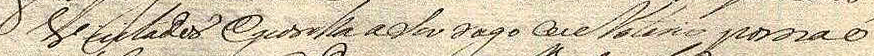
Visitador e por ella a Seu rogo eu Notario por naõ
